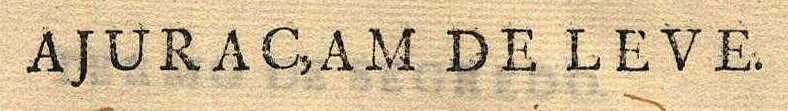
AJURAÇAM DE LEVE.
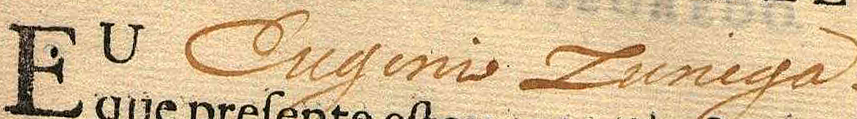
EU Eugenio Zuniga
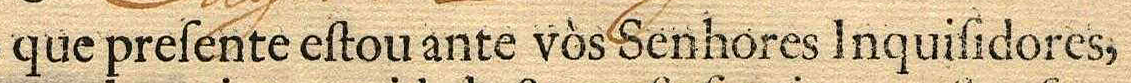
que presente estou ante vòs Senhores Inquisidores,
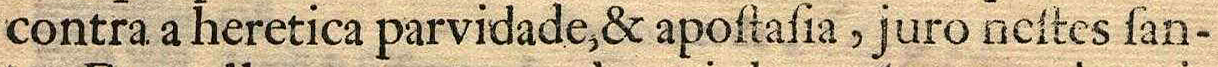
contra a heretica parvidade, & apostasia, juro nestes san
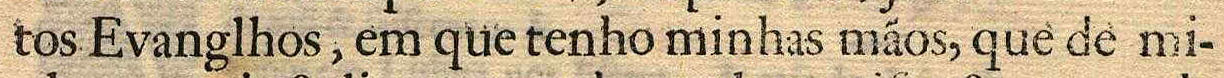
tos Evanglhos, em que tenho minhas mãos, que de mi
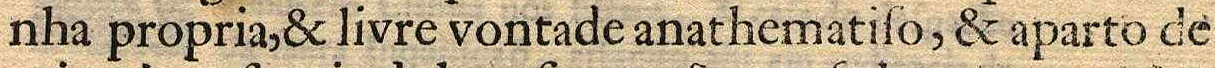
nha propria, & livre vontade anathematiso, & aparto de
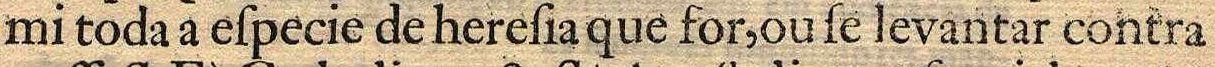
mi toda a especie de heresia que for, ou se levantar contra
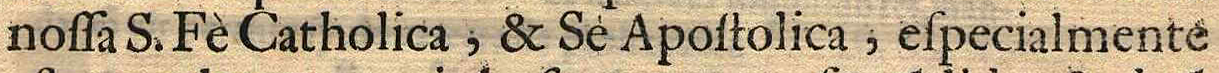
nossa S. Fè Catholica, & Sé Apostolica, especialmente
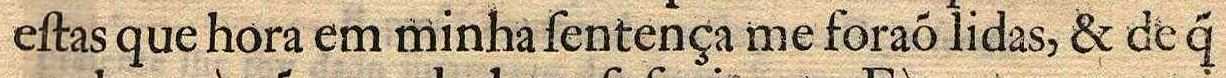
estas que hora em minha sentença me foraõ lidas, & de q̄
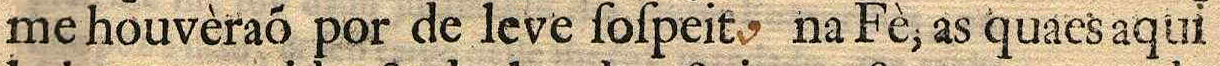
me houvèraõ por de leve sospeito na Fèe, as quaes aqui
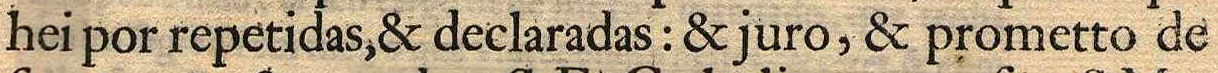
hei por repetidas, & declaradas: & juro, & prometto de
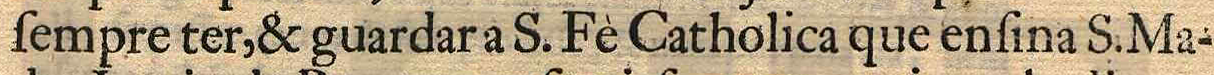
sempre ter, & guardar a S. Fè Catholica que ensina S. Ma
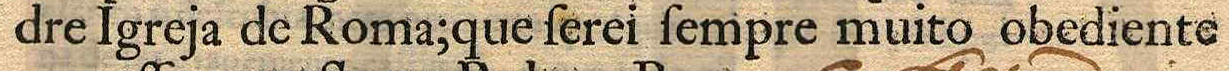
dre Igreia de Roma; que serei sempre muito obediente
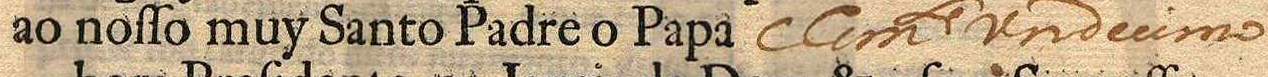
ao nosso muy Santo Padre o Papa Clemte Vndecimo
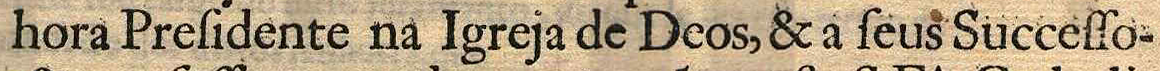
hora Presidente na Igreja de Deos, & a seus Successo
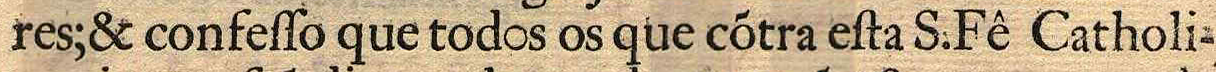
res, & confesso que todos os que cōtra esta S. Fê Catholi
